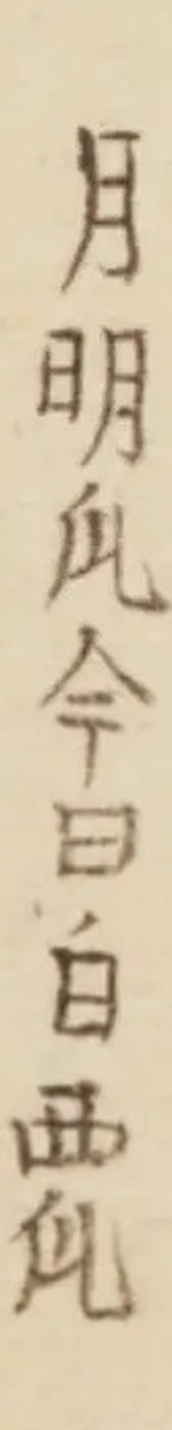月明瓜今日白西瓜

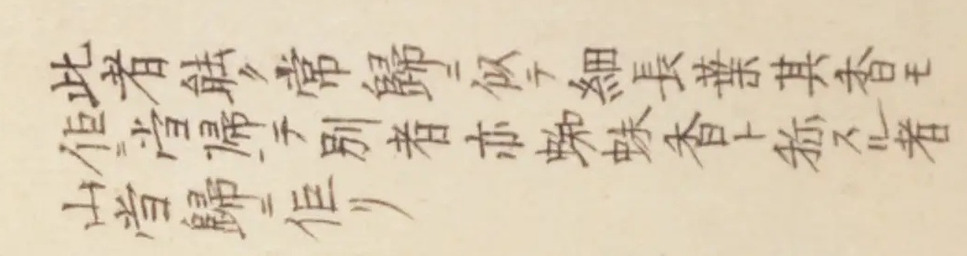佢当帰別者亦蜘蛛香ト称スル者
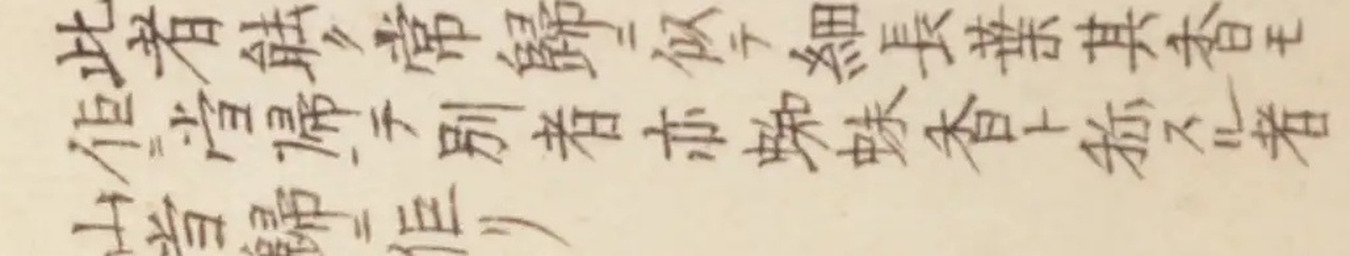佢当帰別者亦蜘蛛香ト称スル者

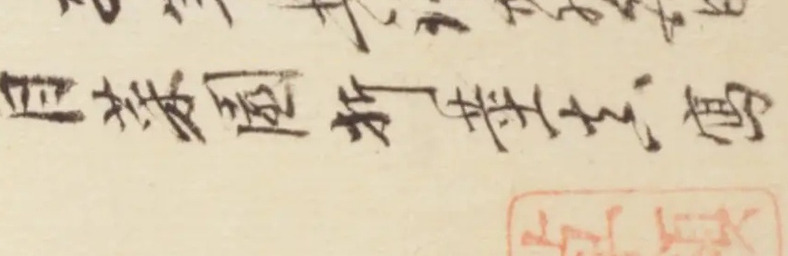自菜園折茎真写
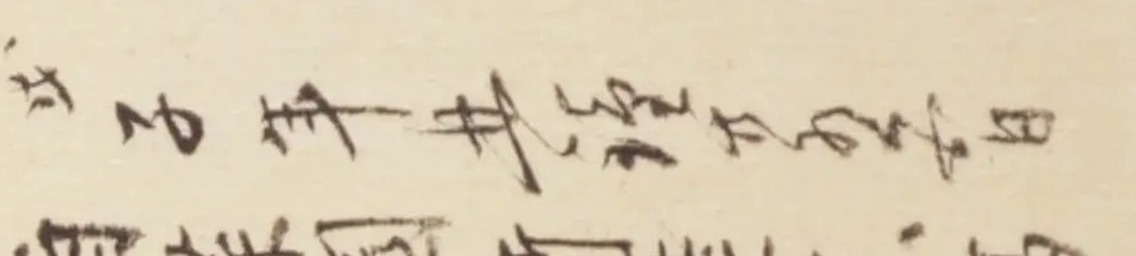戊子年林鐘廿有五日
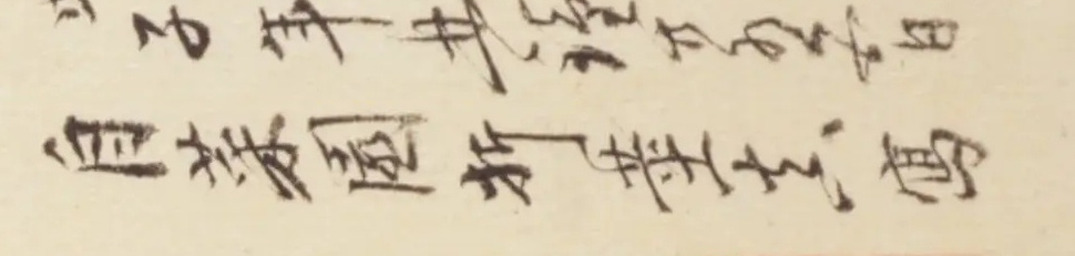自菜園折茎真写
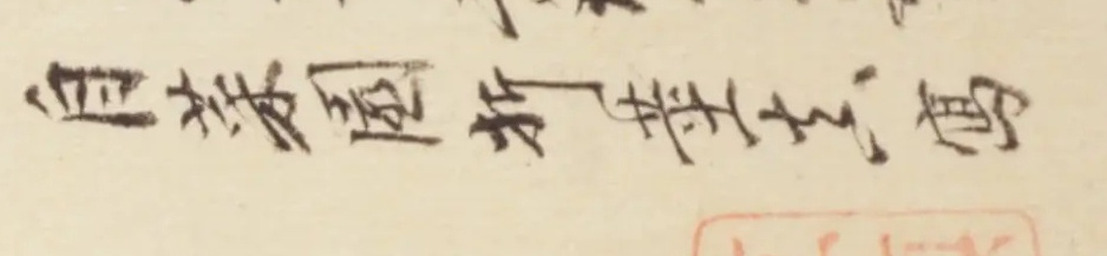自菜園折茎真写

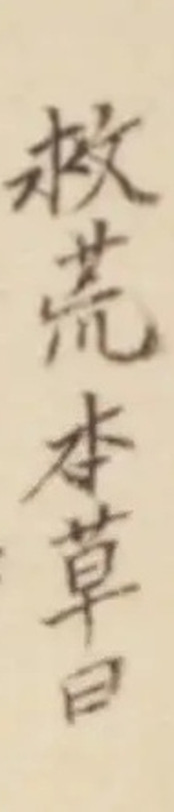救荒本草曰
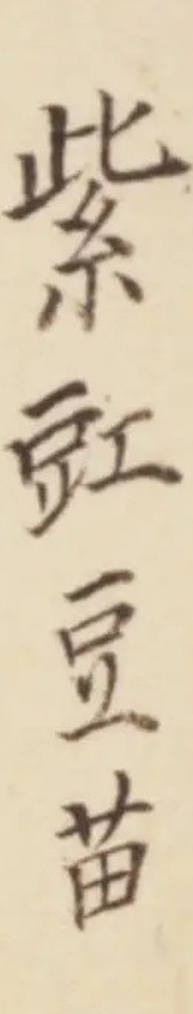紫豇豆苗
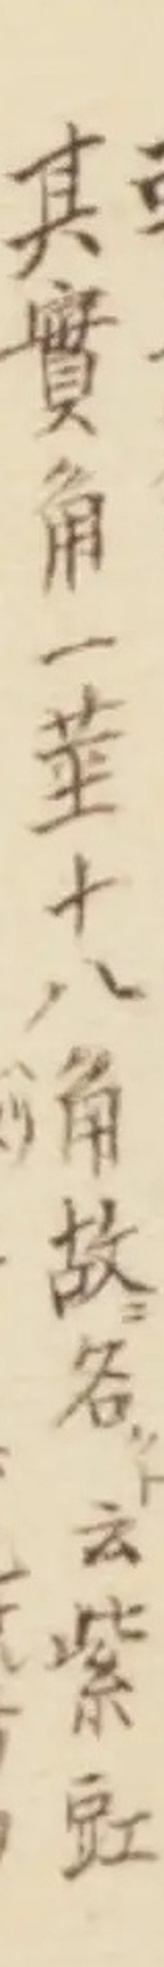其美角一茎十八角故故名云紫豇
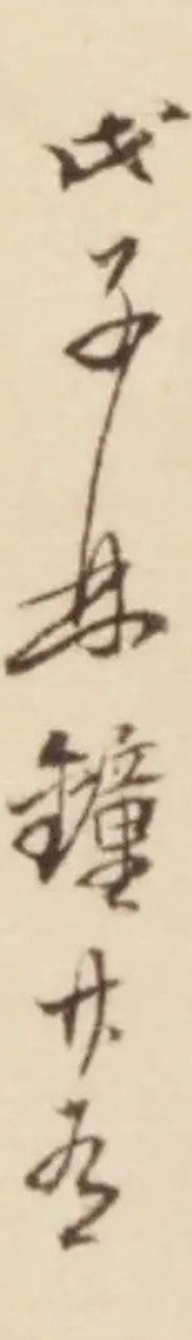戊子林鐘廿有
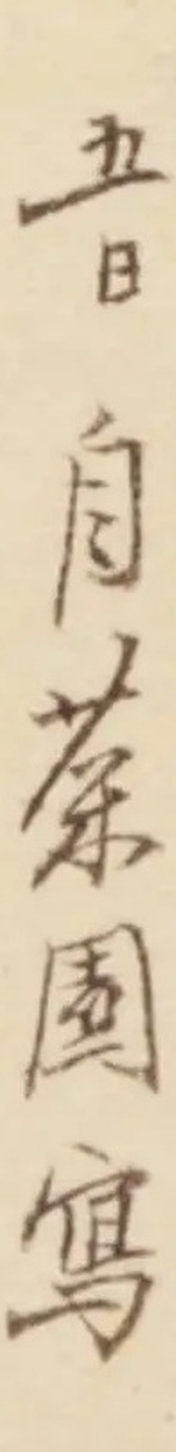五日自菜園写

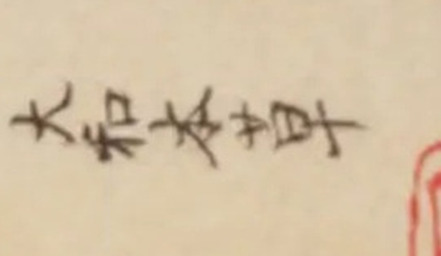大和本草
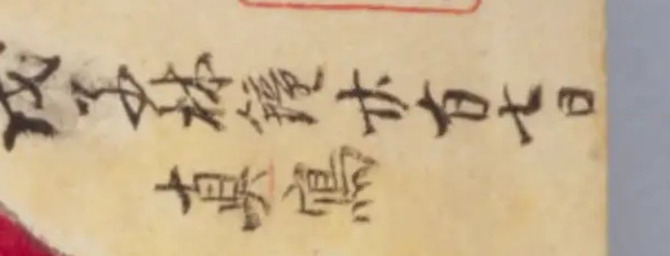戊子林鐘廿有七日
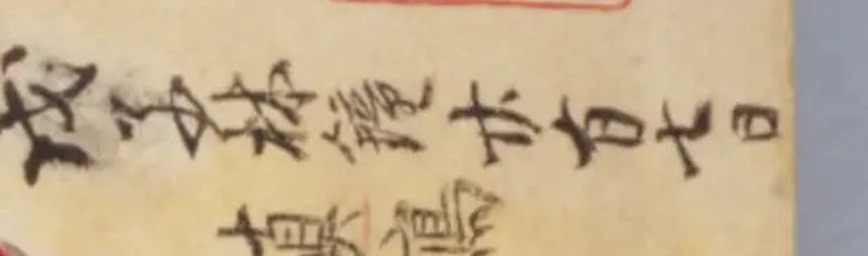戊子林鐘廿有七日
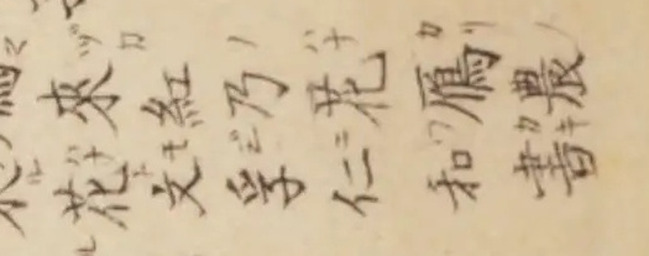雁来紅乃花鴈農
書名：梅園草木花譜夏之部. 4
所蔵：国立国会図書館 National Diet Library, JAPAN
